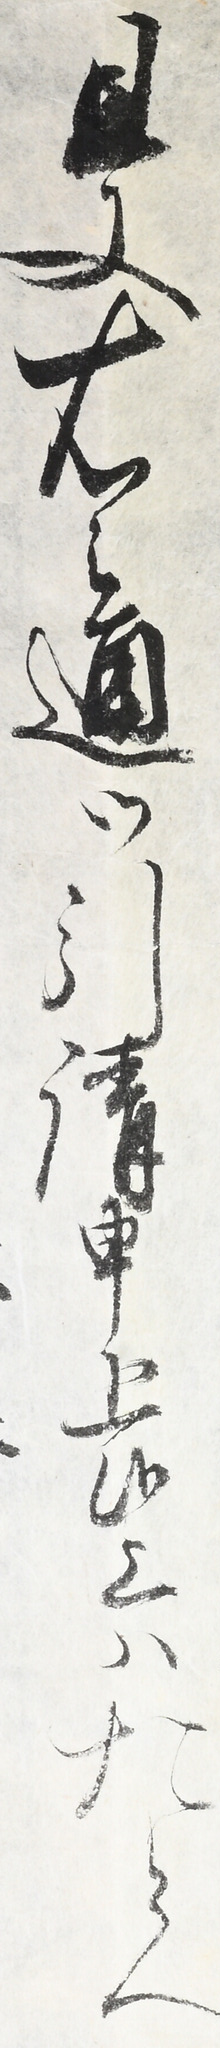且又右之通御引請申上候上ハたとへ
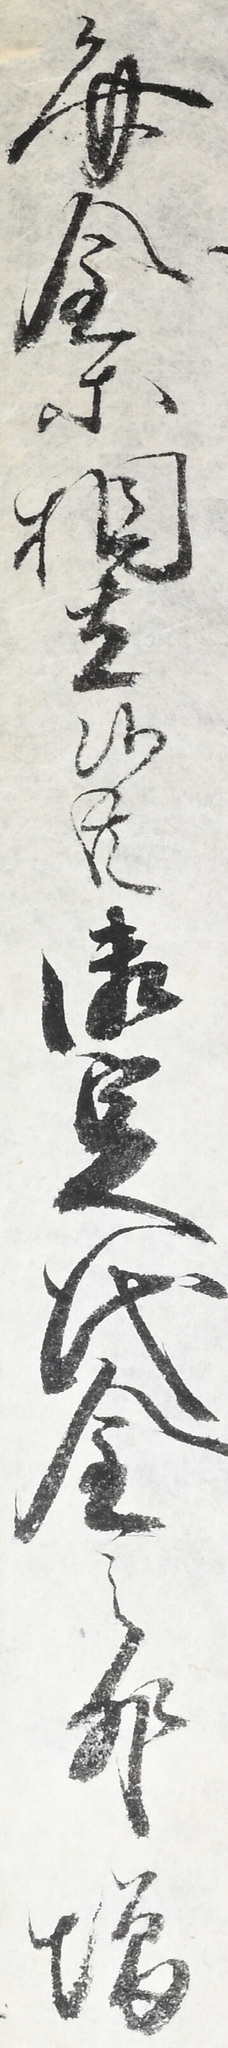弁金等相立候共御定代金之外増

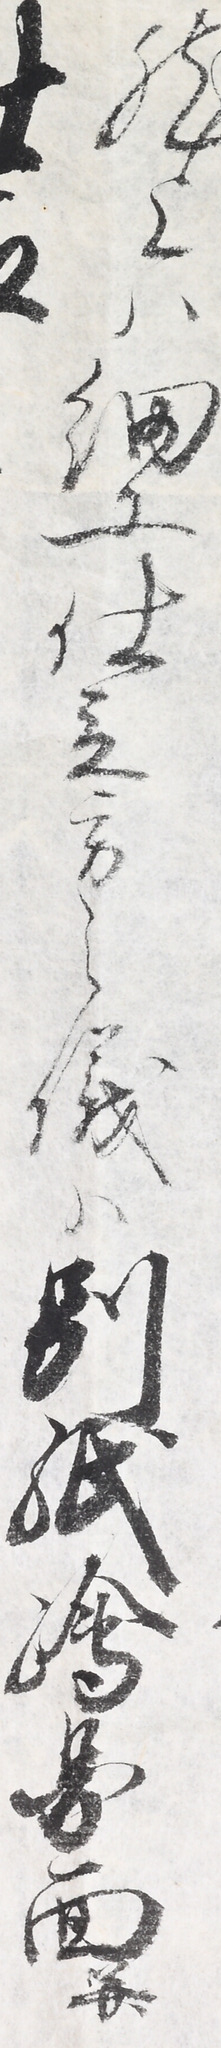然上ハ細工仕立方之儀ハ別紙絵図面并
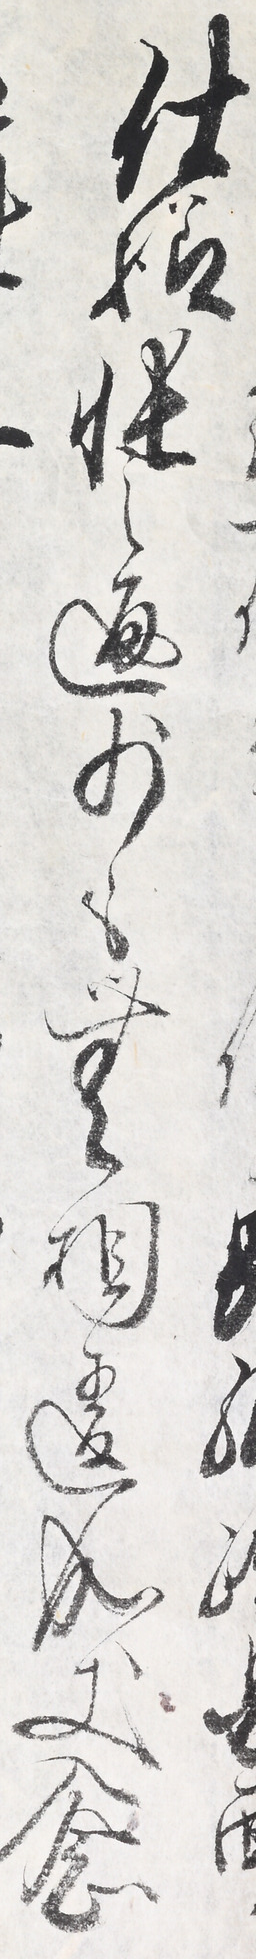仕様帳之通少も無相違成丈入念
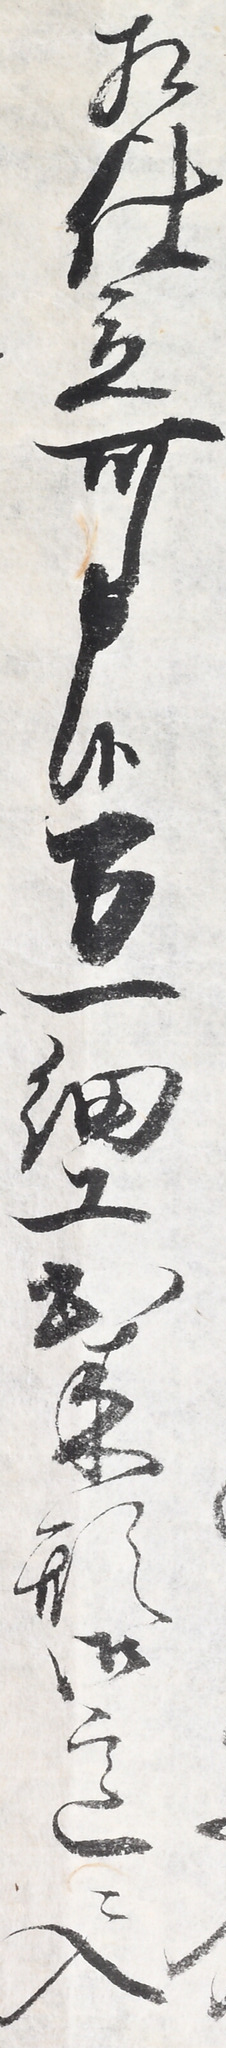相仕立可申候万一細工出来形御意ニ入
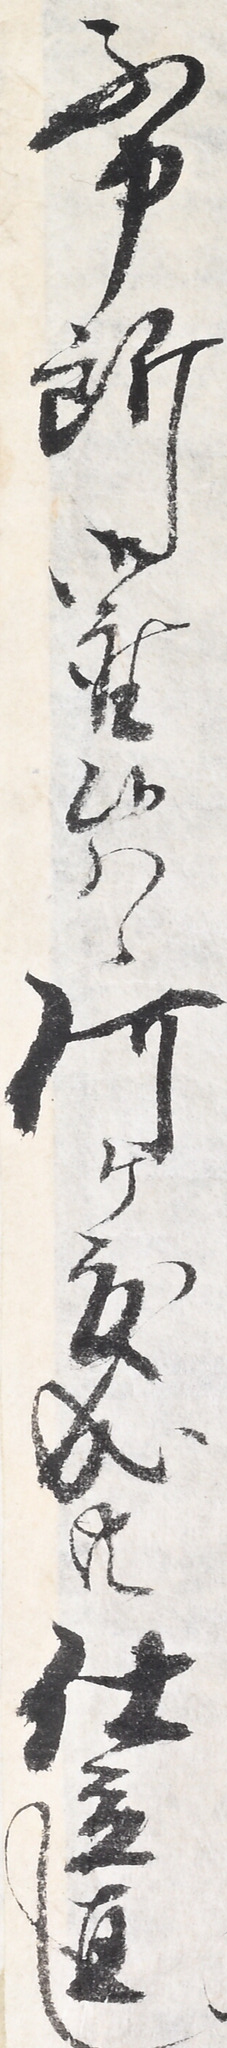不申所御座候ハヽ何ヶ度成共仕立直し
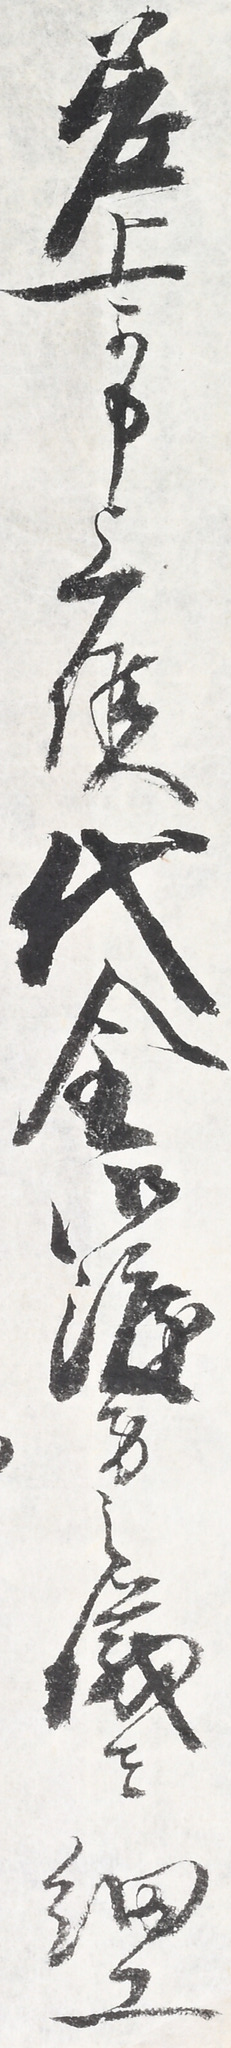差上可申上候代金御渡方之儀は細工
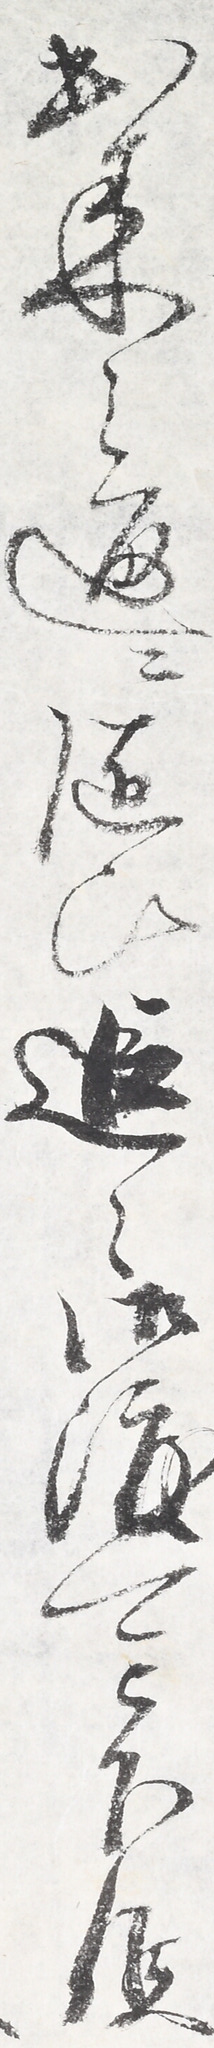出来之通ニ随ひ追々御渡可被下候
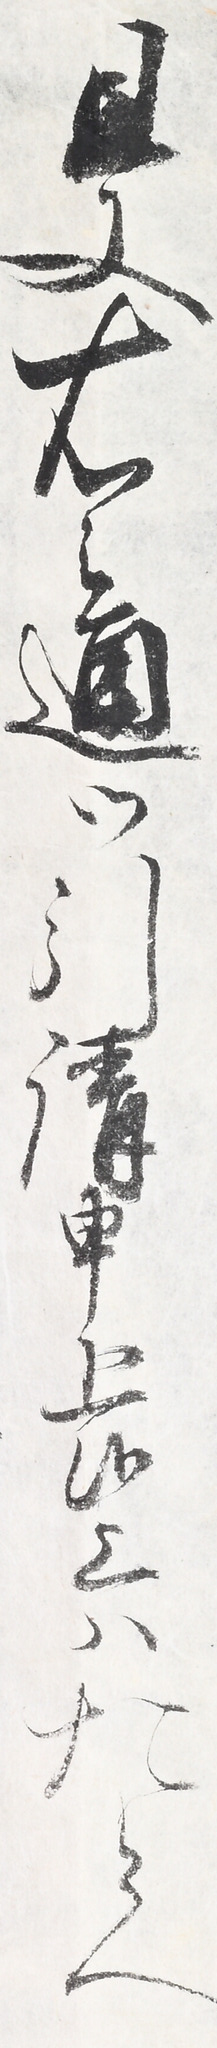且又右之通御引請申上候上ハたとへ
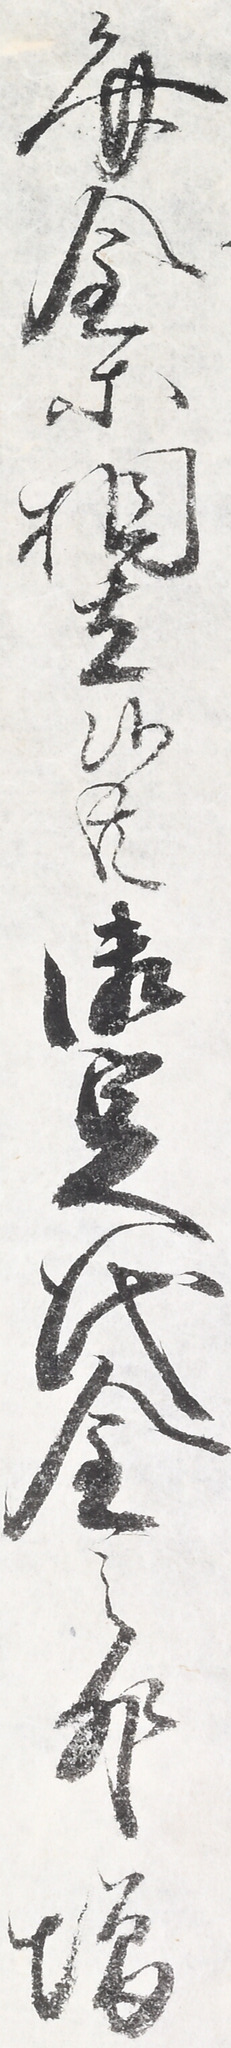弁金等相立候共御定代金之外増
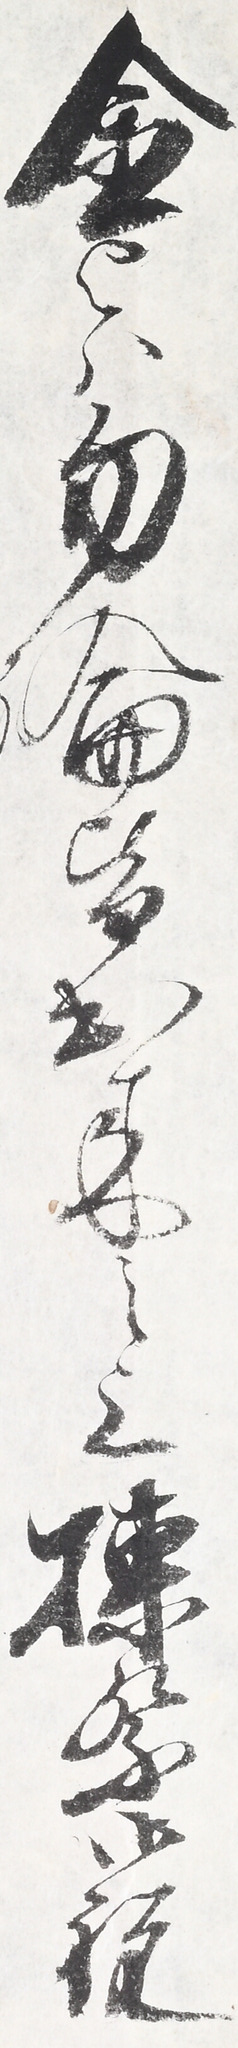金とハ勿論皆出来之上棟祭御祝
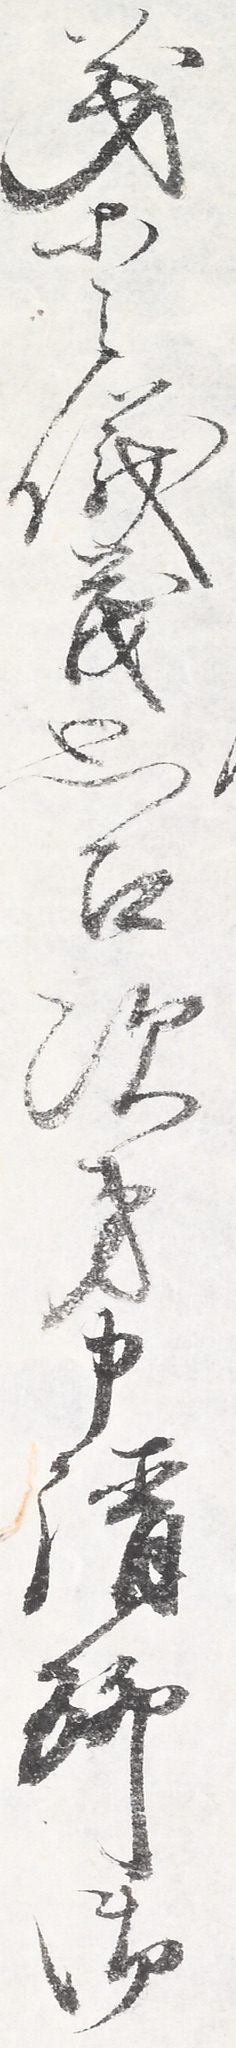義等之儀茂思召次第申請聊御
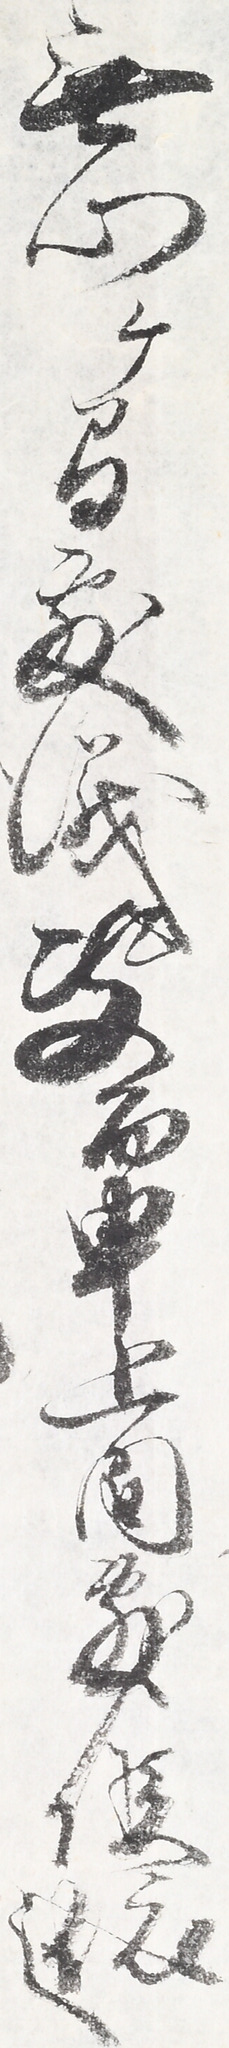無心ヶ間敷儀決而申上間敷候依之
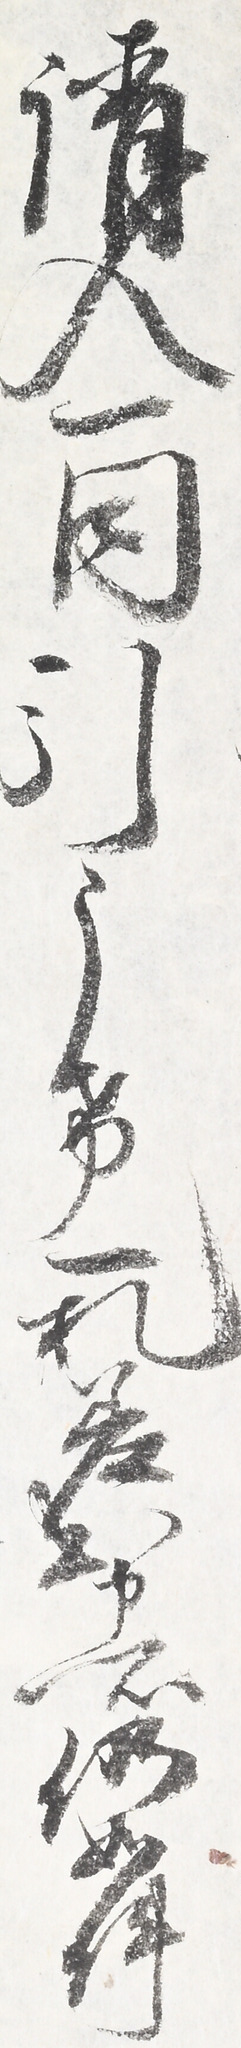請人一同引うけ一札差出申所仍如件
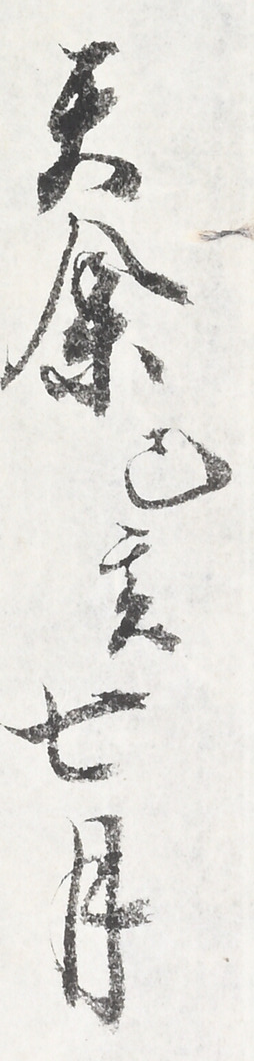天保己亥七月
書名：差出申御請證文之事
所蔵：伊那市立高遠町図書館・合同会社AMANE
